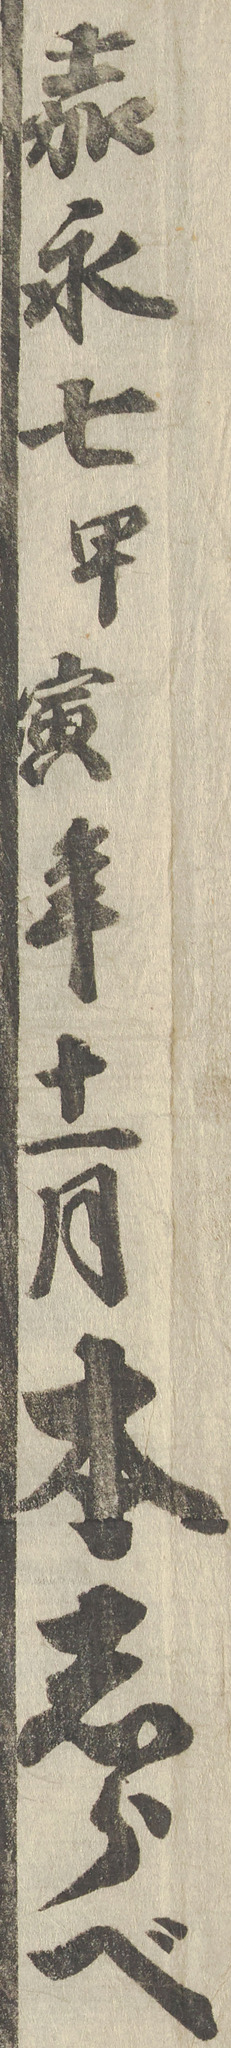嘉永七年甲寅年十一月本しらべ
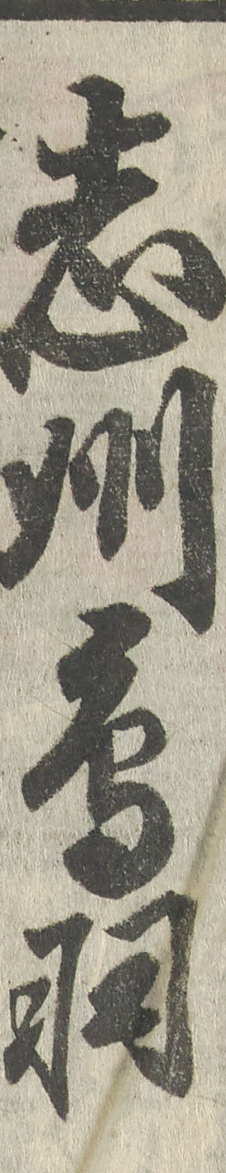志州鳥羽
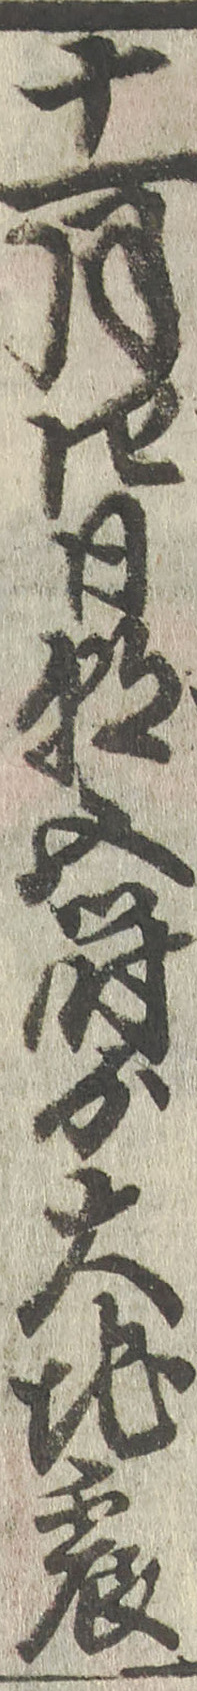十一月四日朝五ツ時ゟ大地震
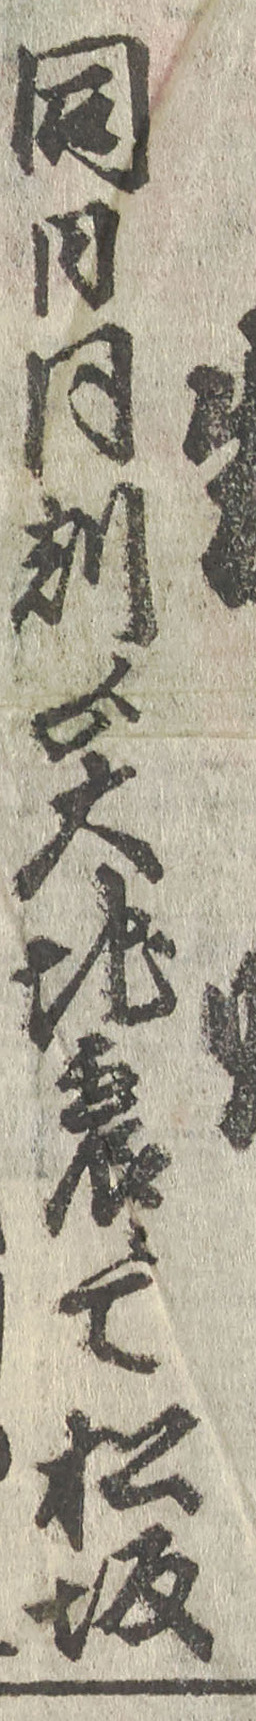同日同刻ゟ大地震にて松坂
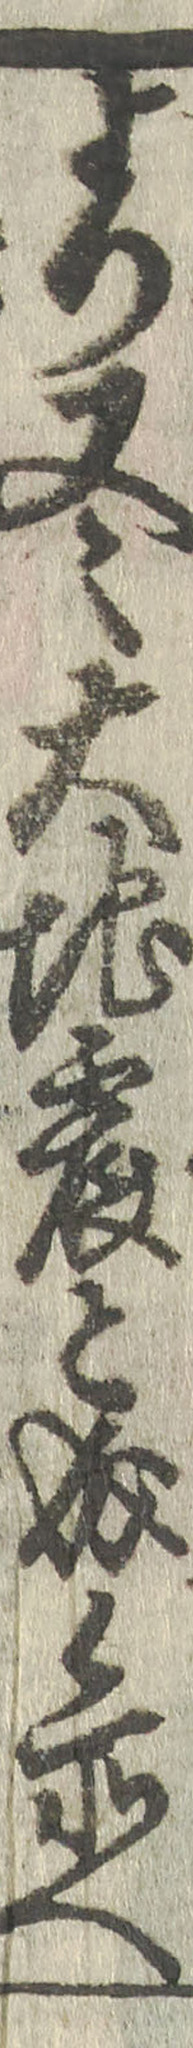より又々大地震と成候所へ
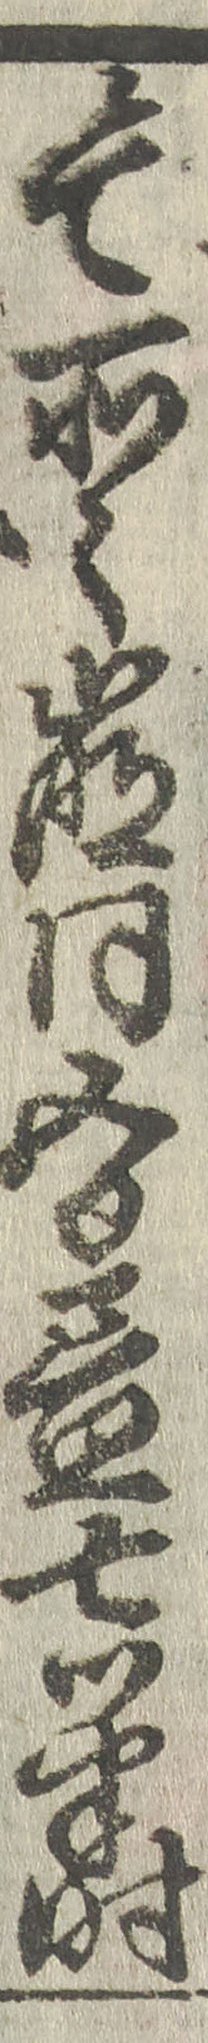にて所々崩同五日昼七ツ半時
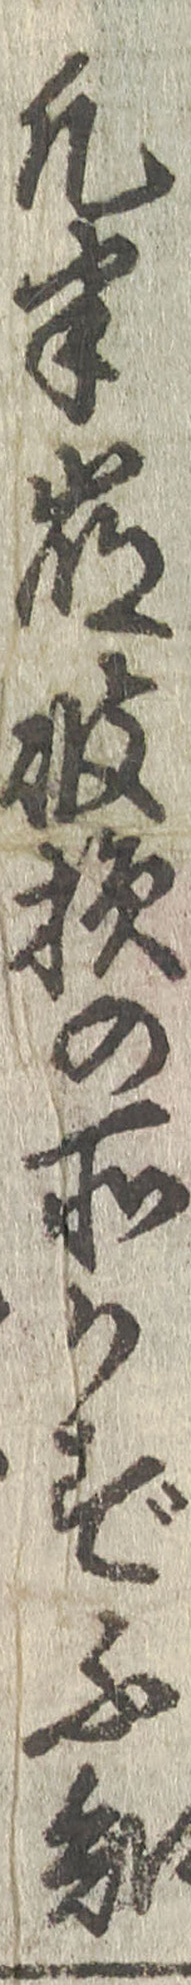凡半崩破損の所かず不知
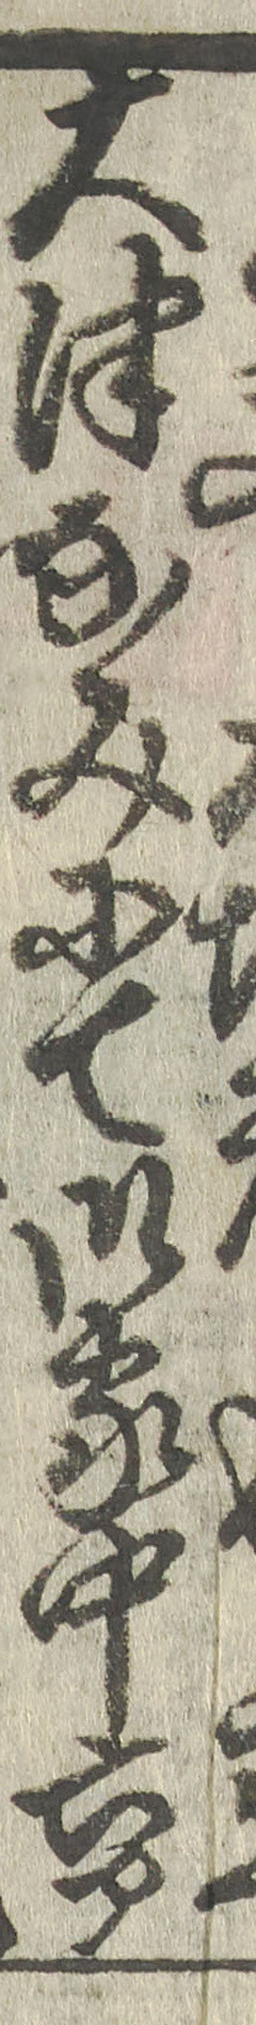大津なみにて御家中六部
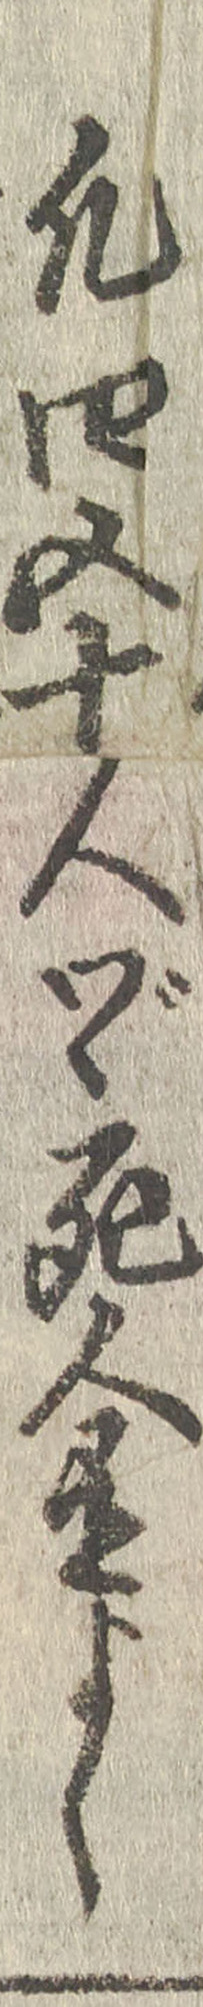凡四五十人ヅヽ死人有よし
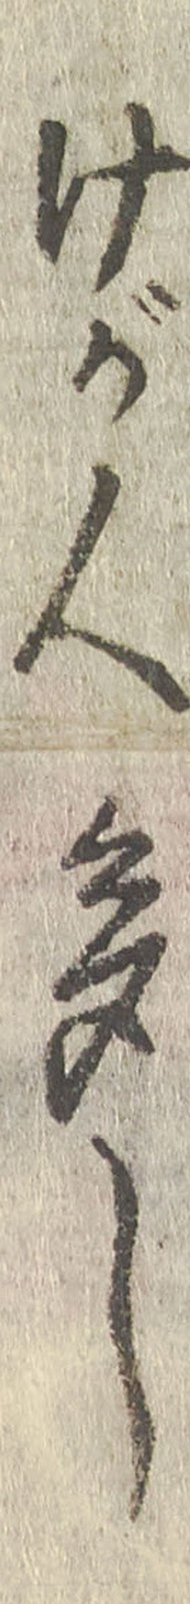けが人多し
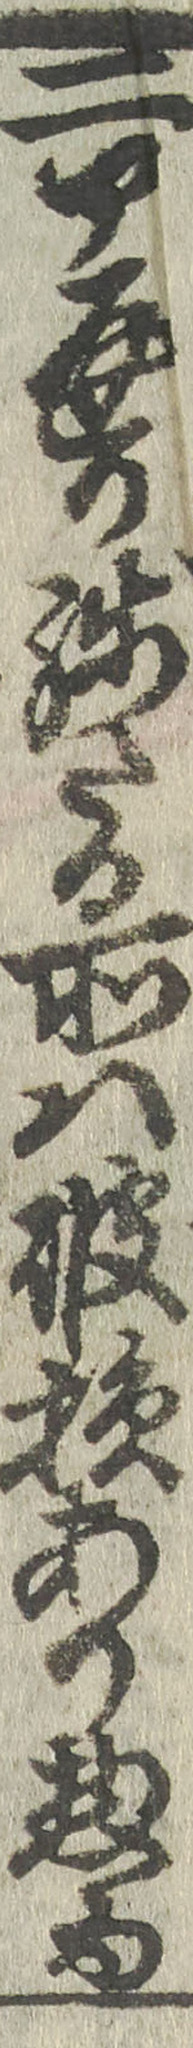二部通り残たる所は破損あり惣而
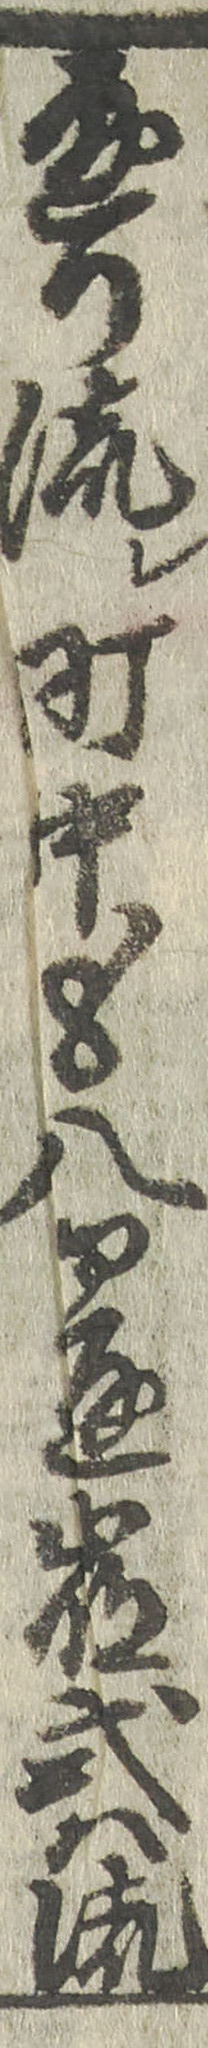通り流レ町中も八部通崩或は流
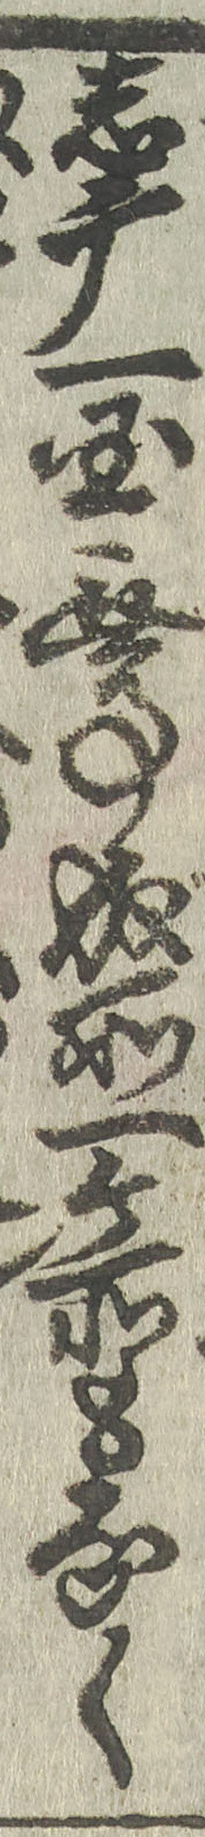志摩一国無事成所一ケ所もなく
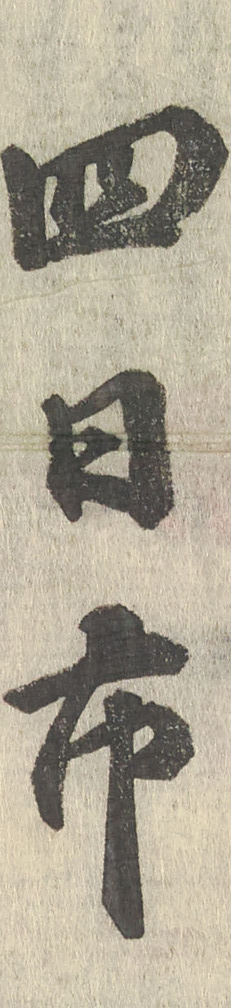四日市
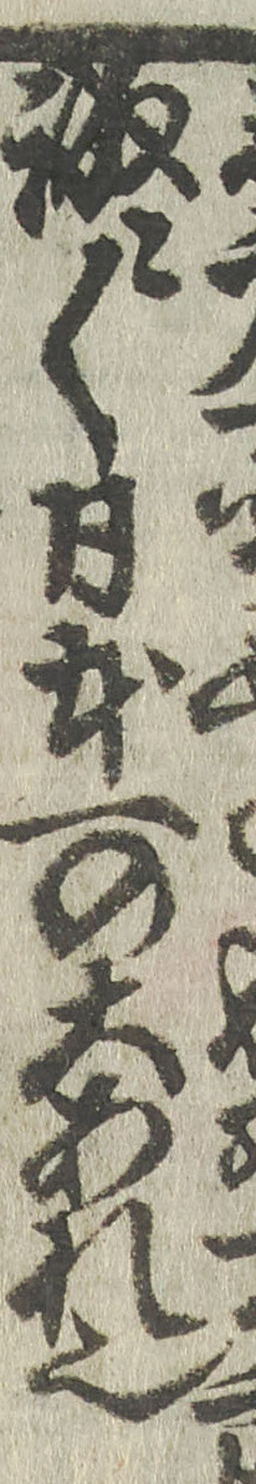誠に〳〵日本一の大あれ也
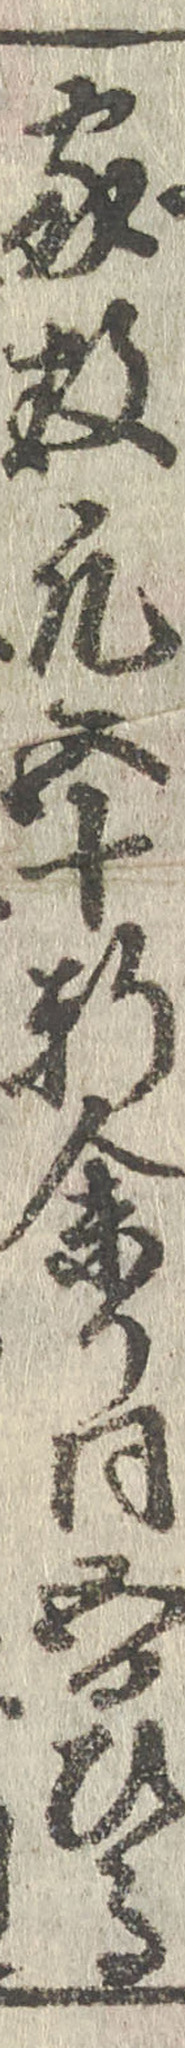家数凡五十軒余り同五日ひる
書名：聞書東海道南海道国々大地震大つなミ
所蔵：東京大学総合図書館 General Library in the University of Tokyo, JAPAN
